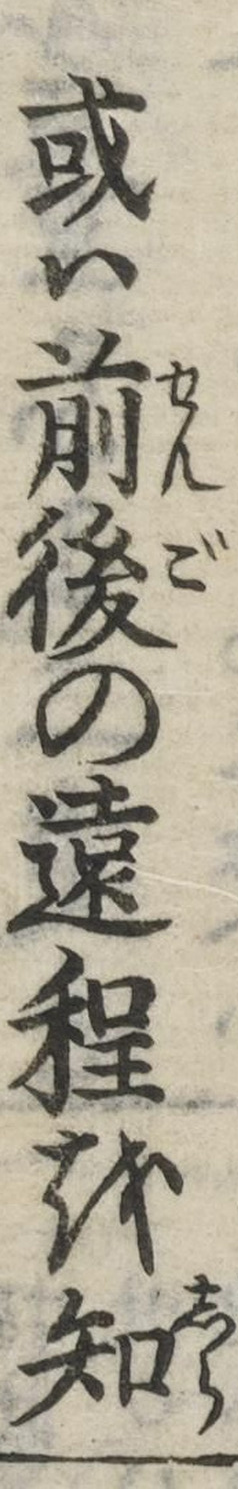或は前後の遠程を知
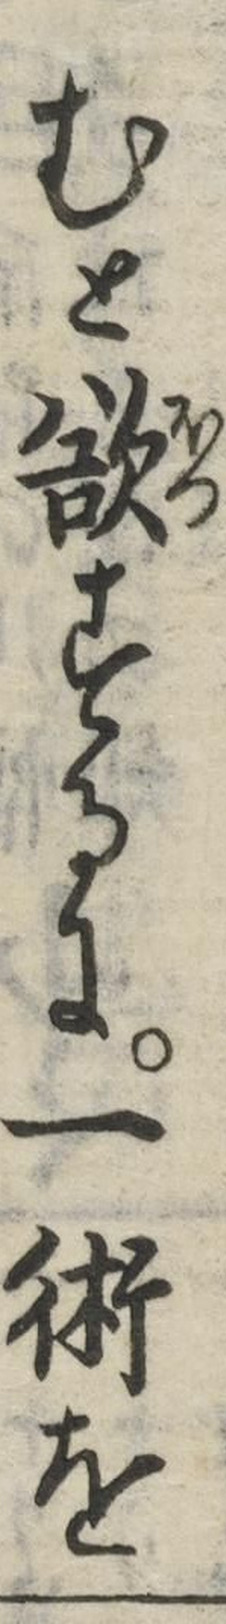むと欲するに。一術を
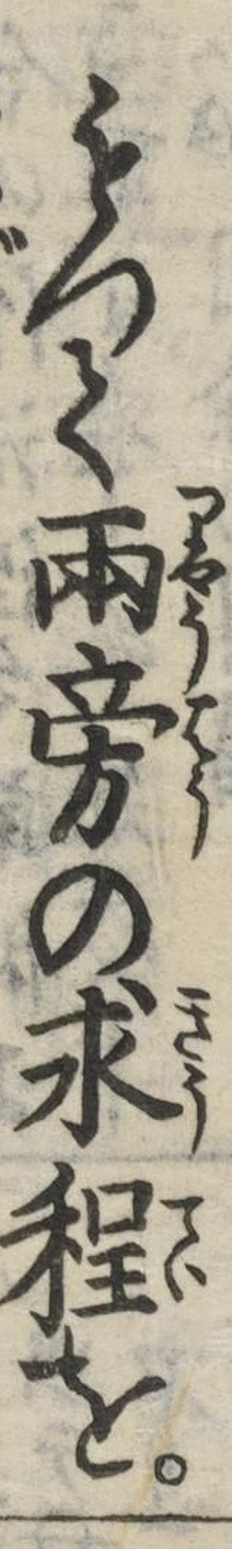もつて兩旁の求程を。
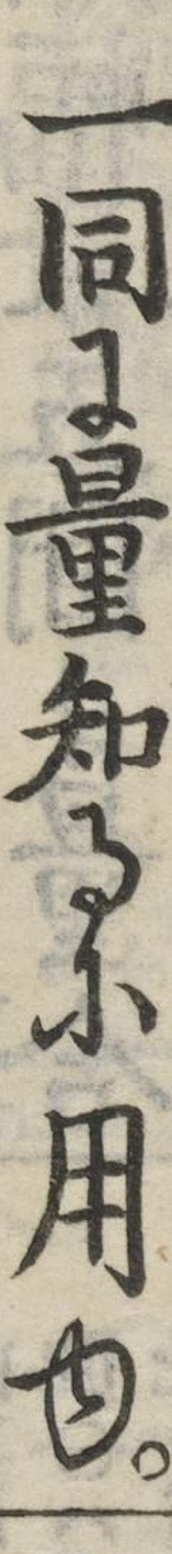一同に量知るに用ね。
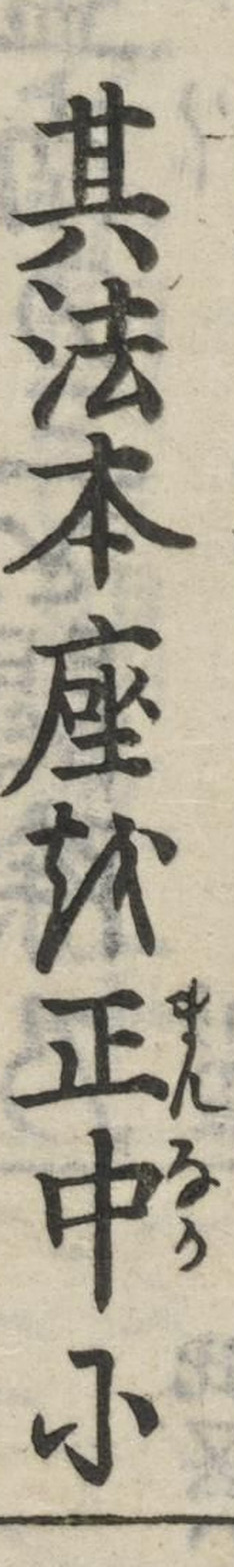其法本座を正中に
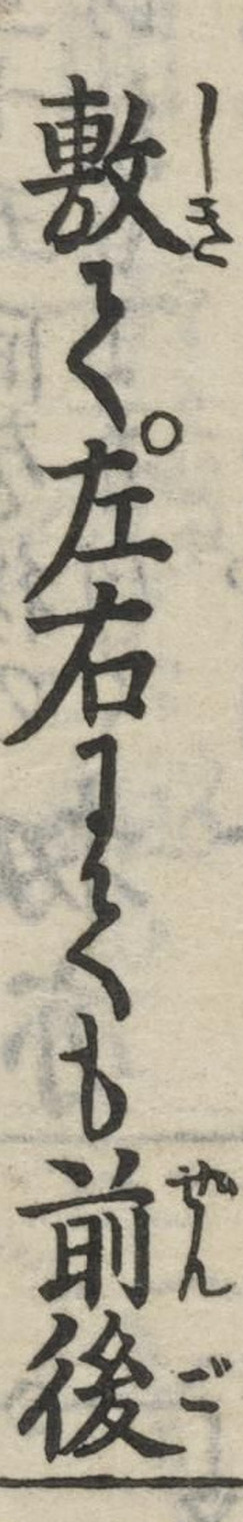敷。左右にても前後
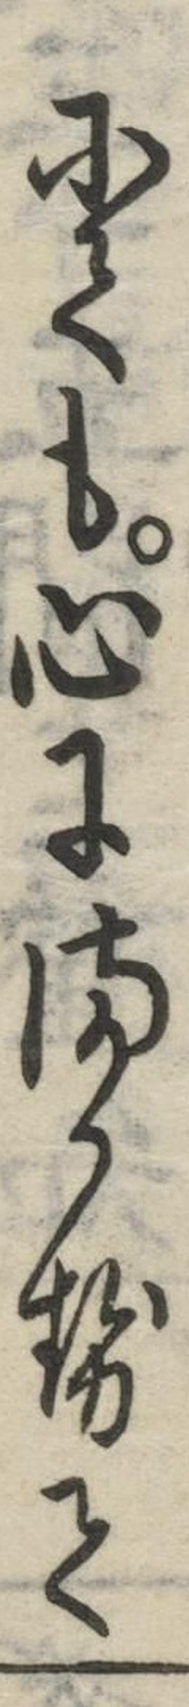にても。心にまかせて
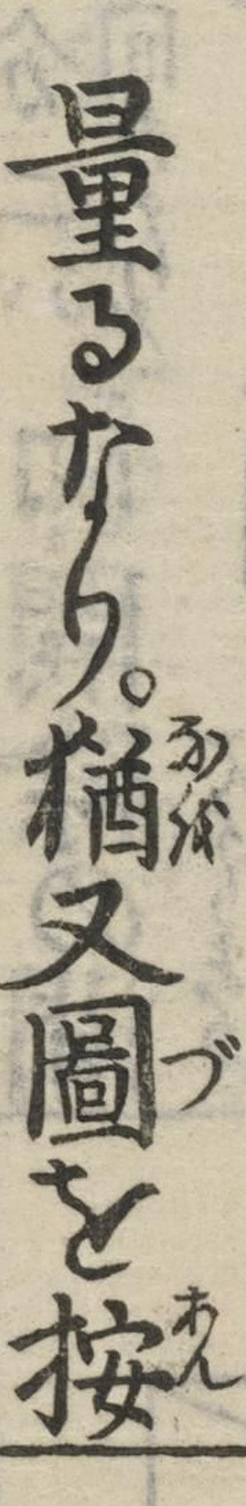量るなり。猶又圖を按
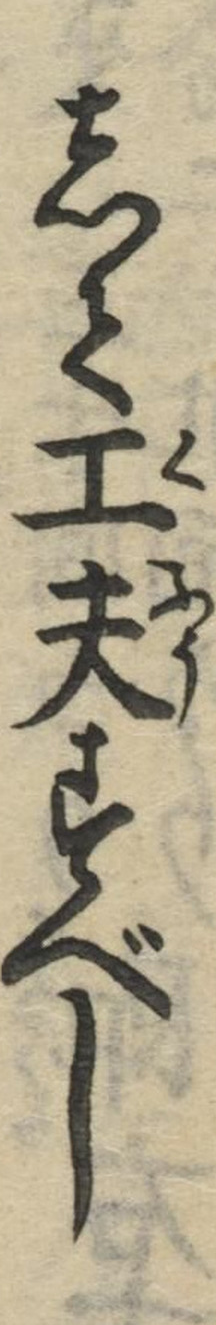して工夫すべし
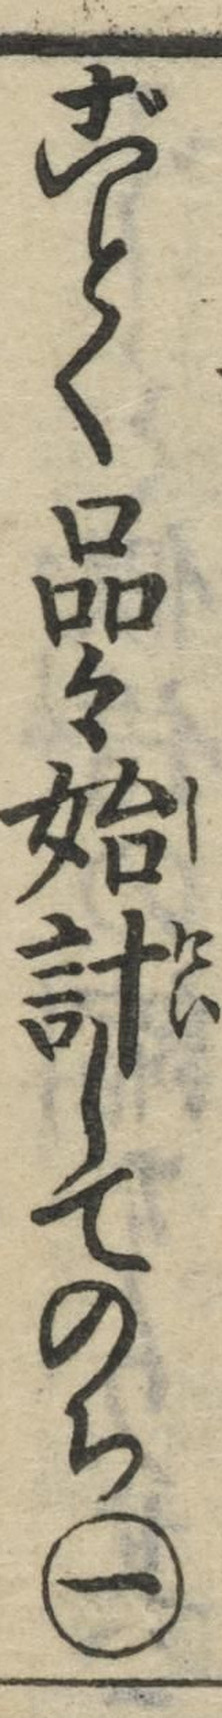ごとく品々始計してのち㊀
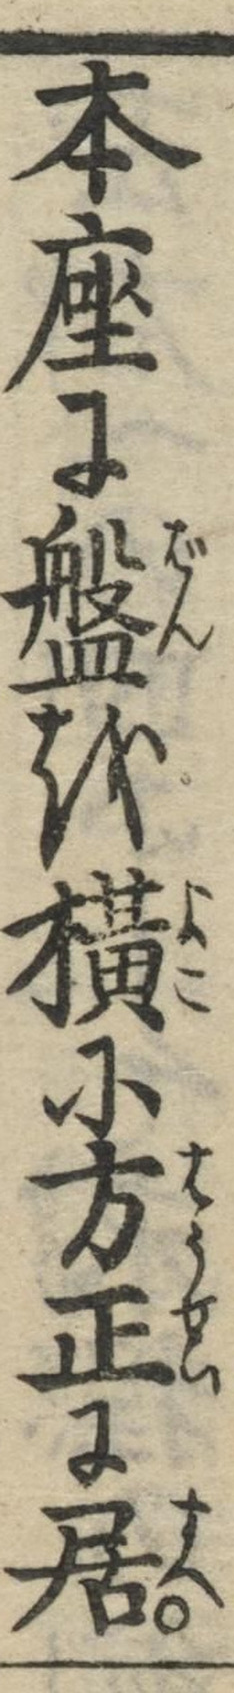本座に盤を横に方正に居。
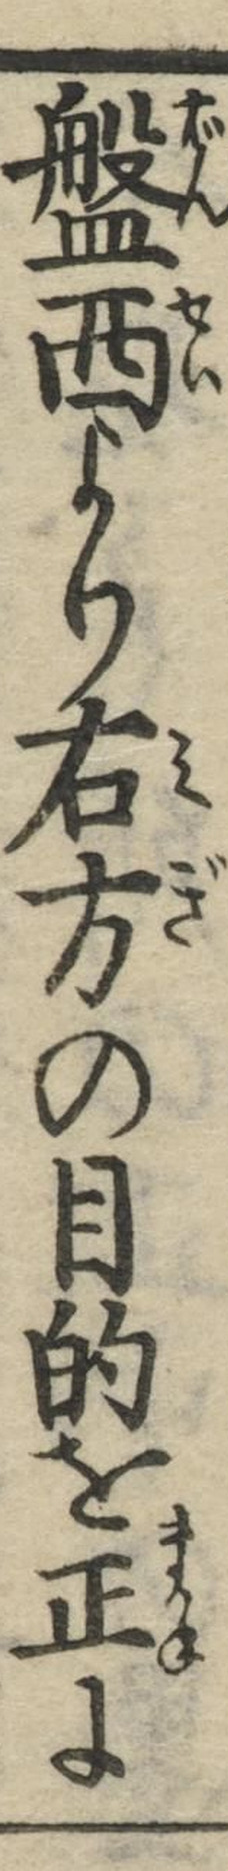盤西より右方の目的を正に
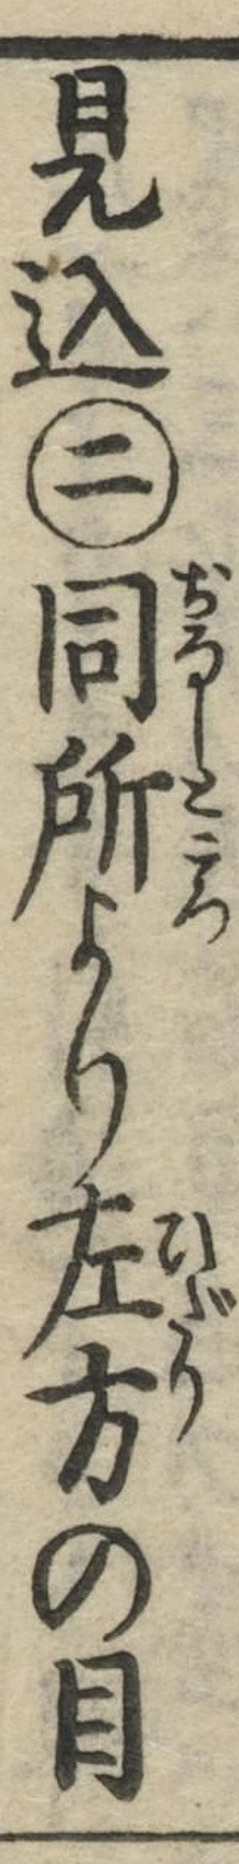見込㊁同所より左方の目
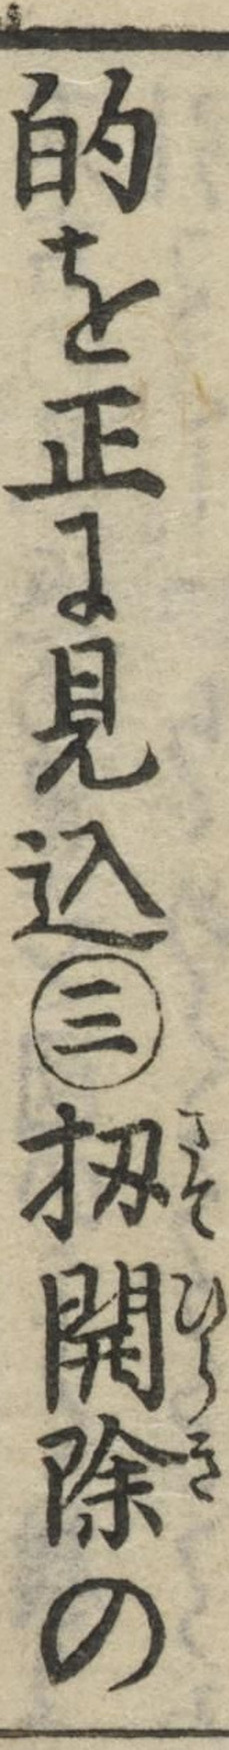的を正に見込㊂扨開除の
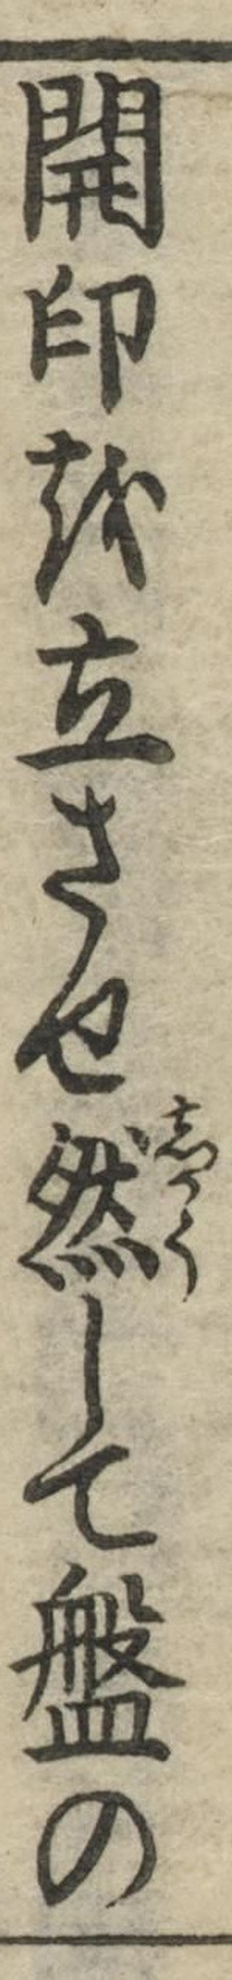開印を立させ然して盤の
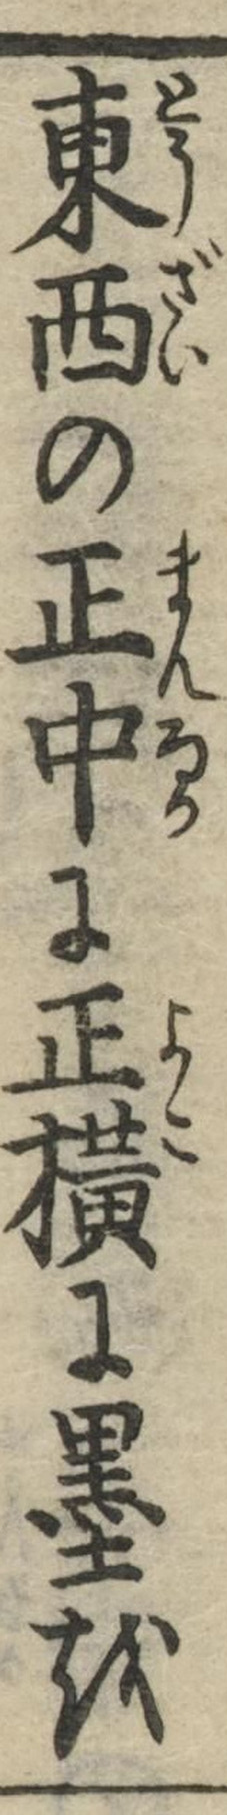東西の正中に正横に墨を
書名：量地指南　巻之二（内題）
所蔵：東京大学地震研究所図書室 Earthquake Research Institute Library, The University of Tokyo, JAPAN
